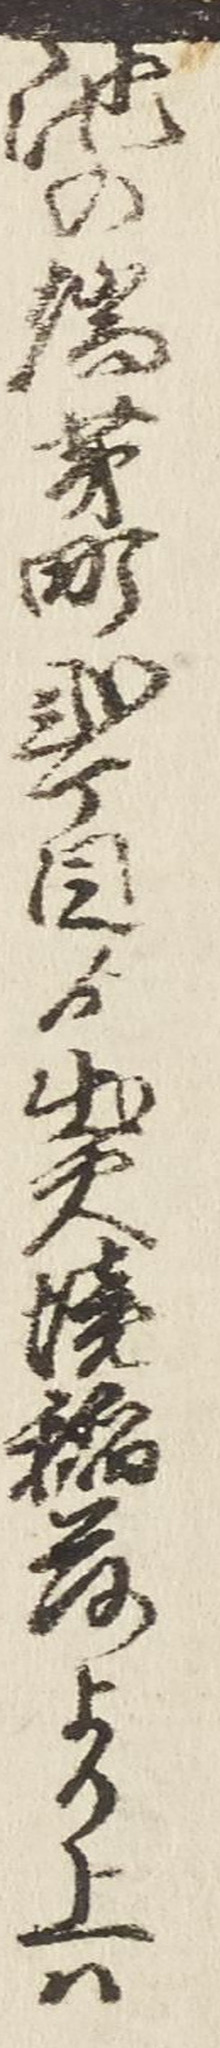池の端茅町弐丁目ゟ出火境稲荷より上は
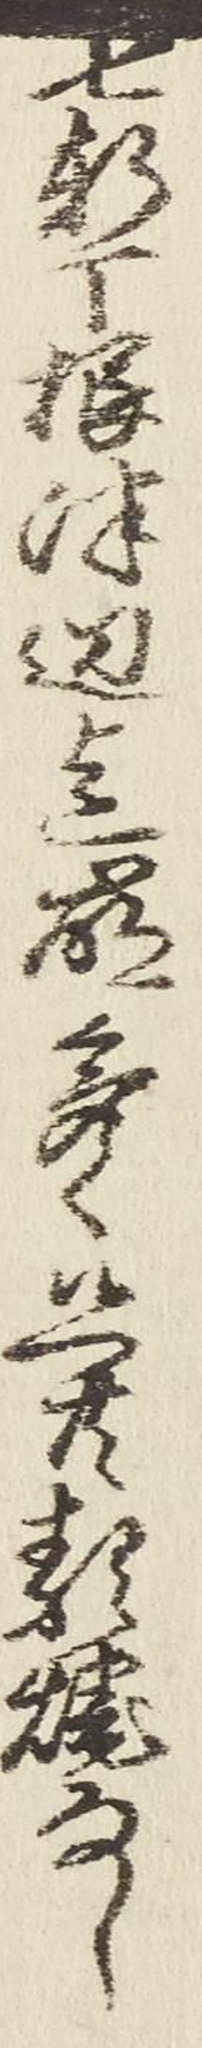七軒丁根津辺迄崩多く候へ共類焼なし
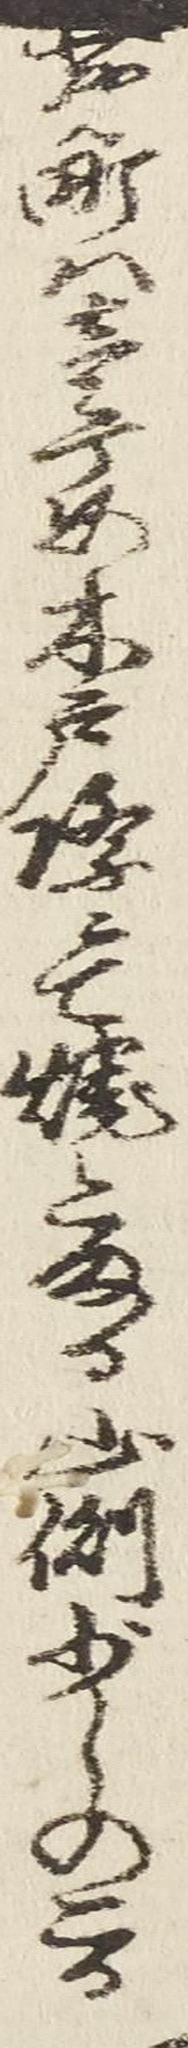茅町は壱丁め木戸際ニて焼とまる山側少しのこる
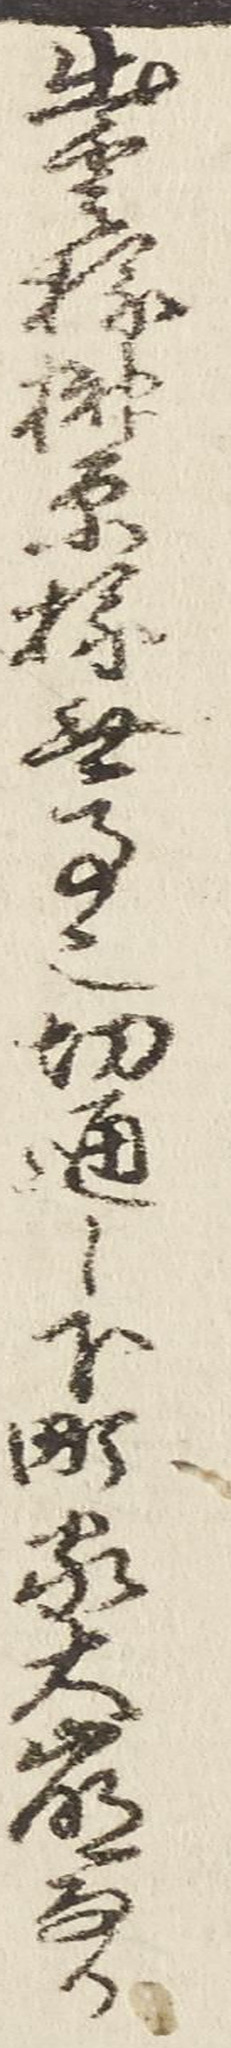出雲様榊原様無事也切通し下町家大崩なり
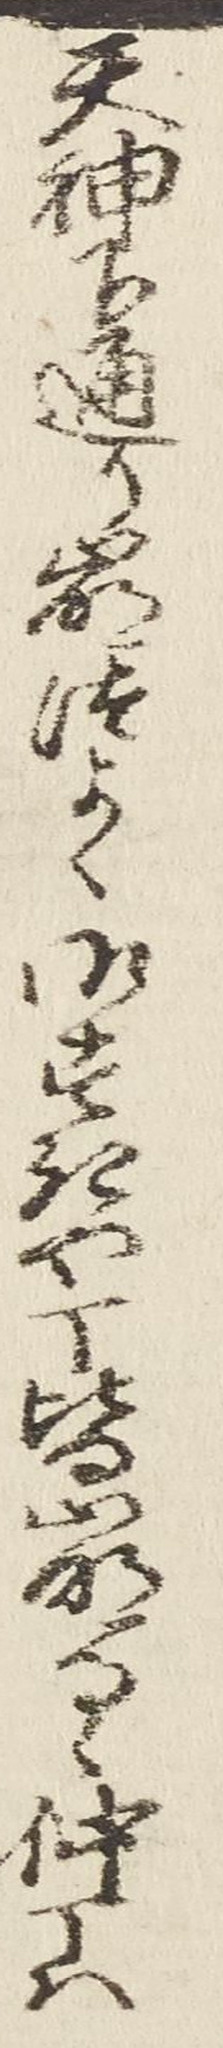天神下通り崩つよく御すきや丁皆崩るゝ仲丁は
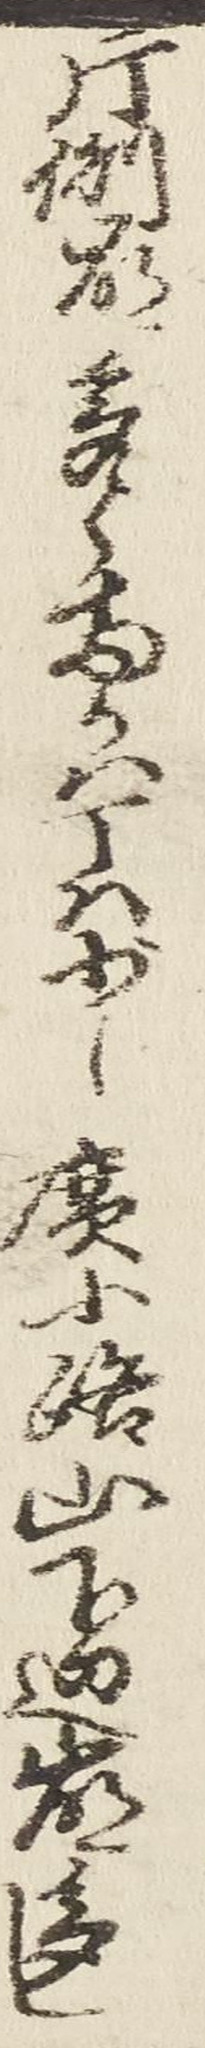片側崩多く両かは丁少し広小路山下辺崩多し
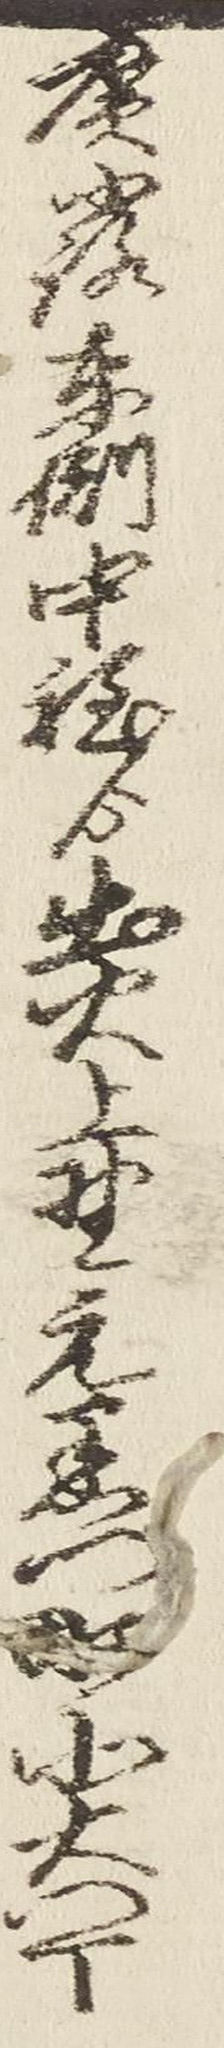広小路東側中程ゟ出火上野元黒門町北大門丁
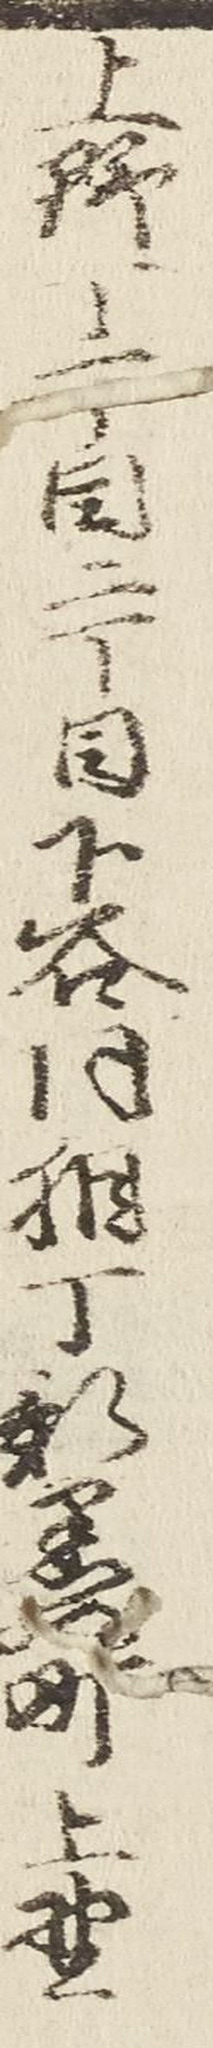上野丁一丁目二丁目下谷同朋丁新黒門町上野
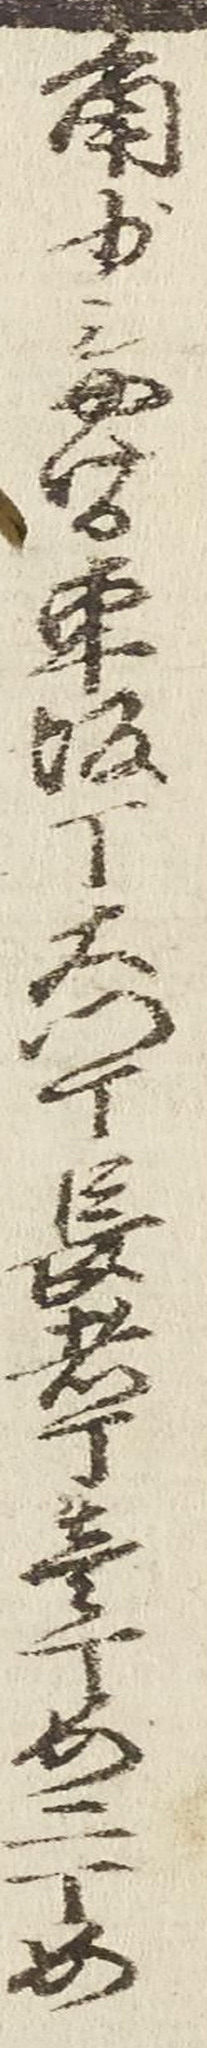角少シやける車坂丁大門丁長者丁壱丁め二丁め
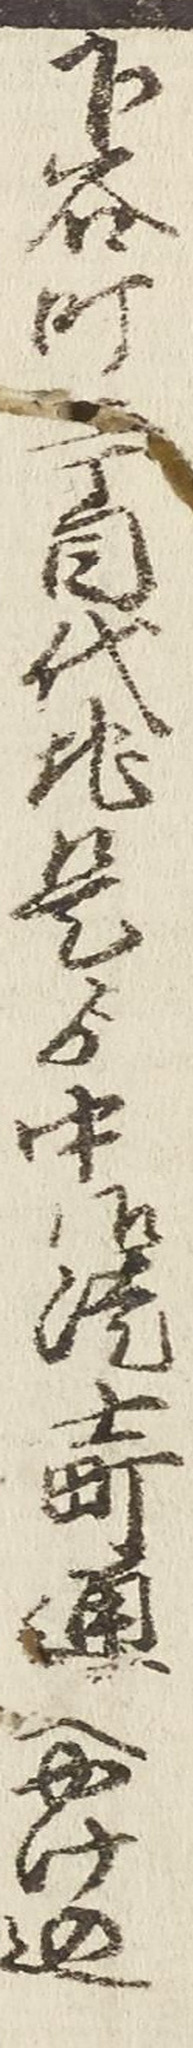下谷町二丁目代地是ゟ中御徒士町通へやけ込
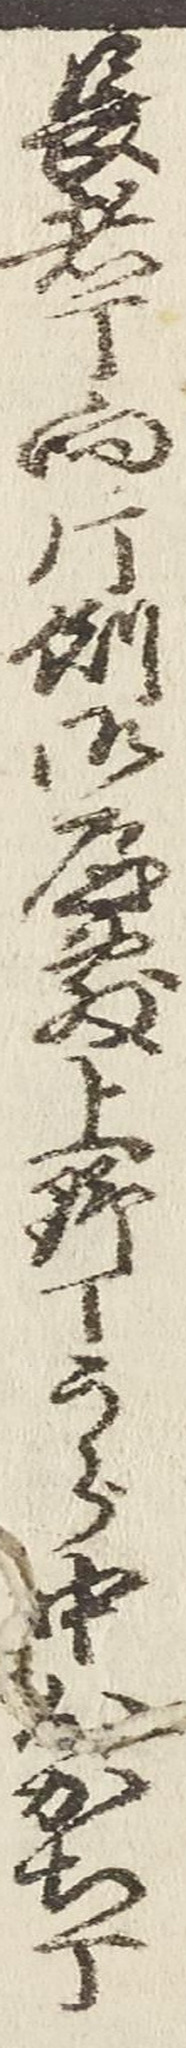長者丁向片側御屋敷上野丁うら中おかち丁
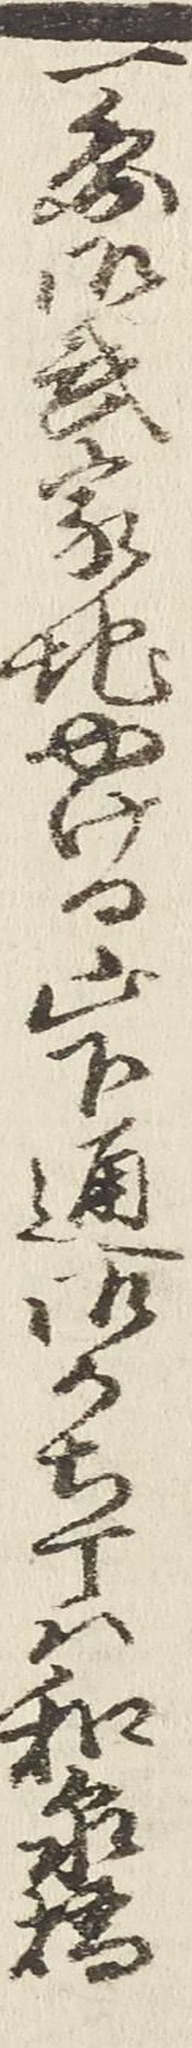一円御武家地やける山下通御かち丁は和泉橋
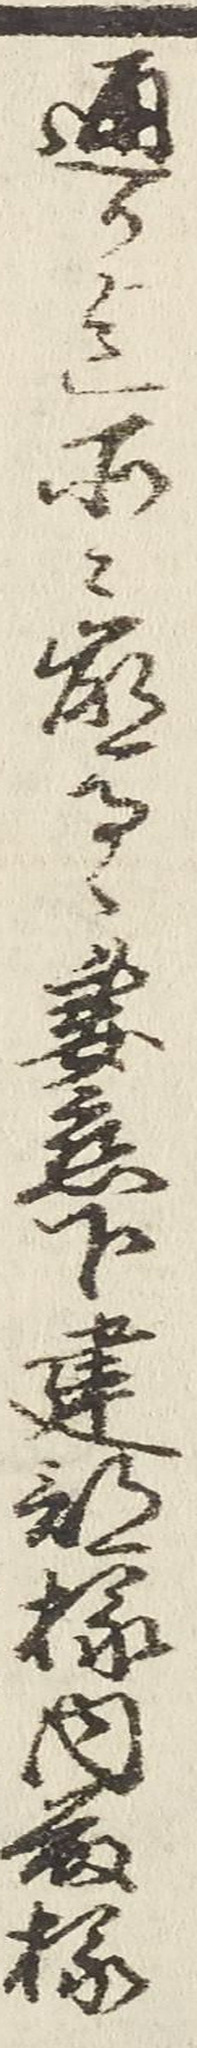通り迄所々崩るゝ妻恋下建部様内藤様
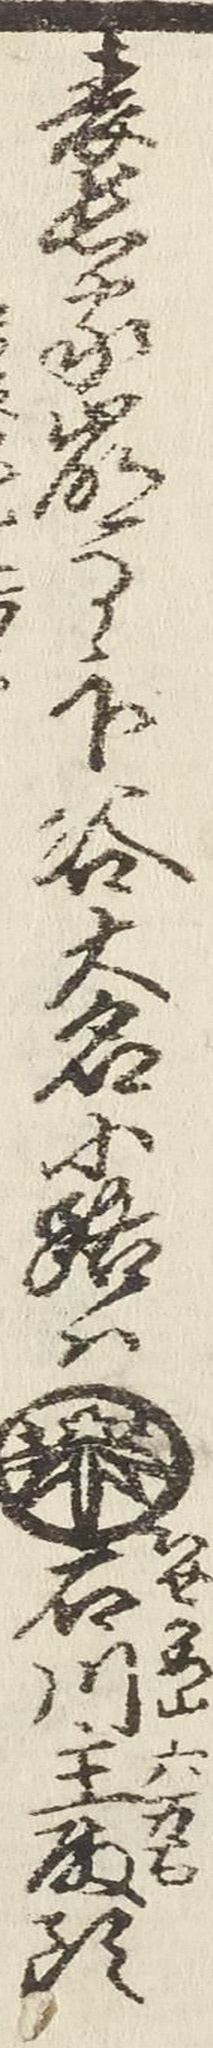表長家崩るゝ下谷大名小路は石川主殿頭
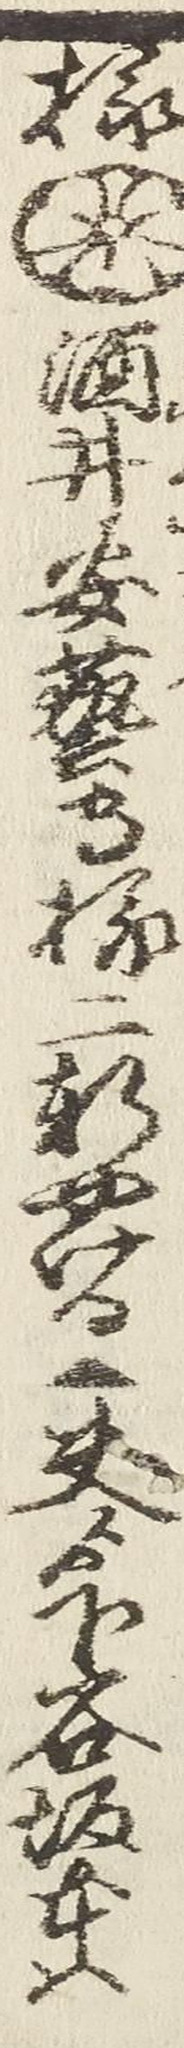様酒井安芸守様二軒やける▲夫ゟ下谷坂本は
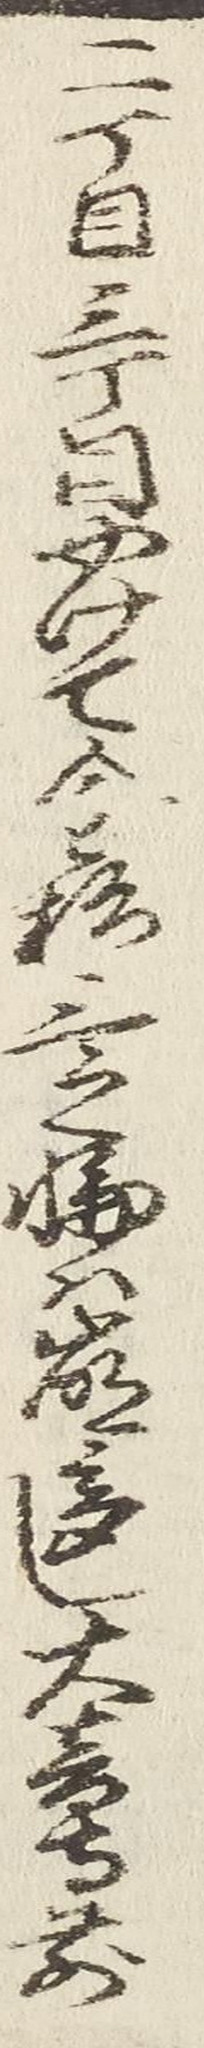二丁目三丁目やけて金杉三之輪は崩多し大音寺前
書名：江戸みやげ
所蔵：東京大学地震研究所図書室 Earthquake Research Institute Library, The University of Tokyo, JAPAN
